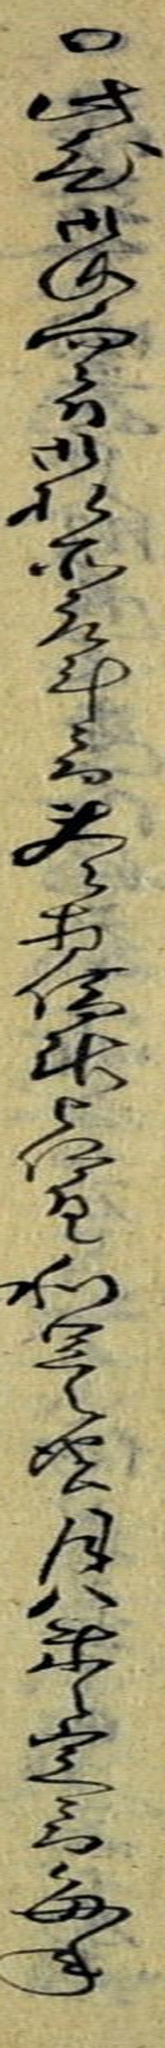〇此度御趣向ニ付御札所取計ニ而夫々拝借銀被仰付候利足之儀ハ月八朱之定ニ而毎年
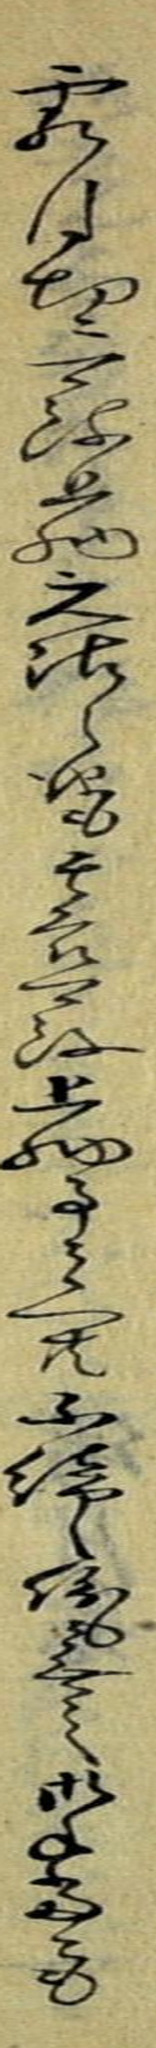霜月切ニ可致上納元銀之儀も其節可致上納事ニ候へ共不締之儀も無之御手当ニも
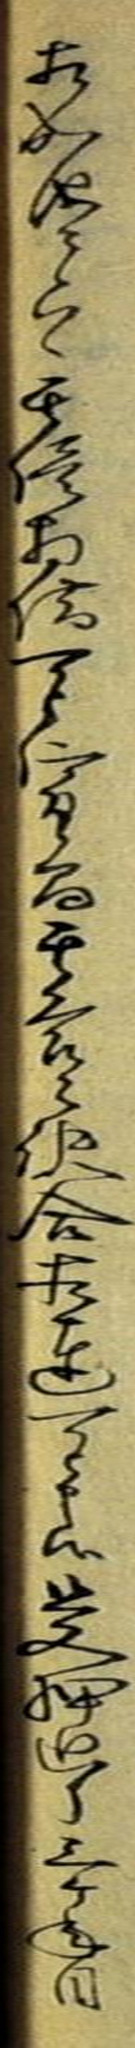相成儀ニ候ハヽ其儘拝借可被仰付候間其節之訳合相達可被申候且又押廻り三ケ年目
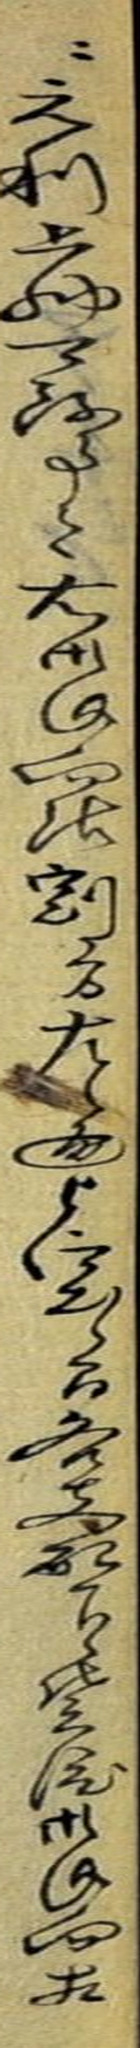ニ元利上納可致事ニ候右御趣向銀割方左之通被仰出候間各支配下へ貸渡御趣向相
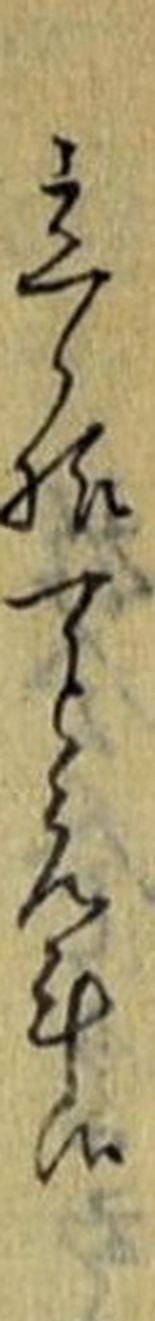立候様可被取計候
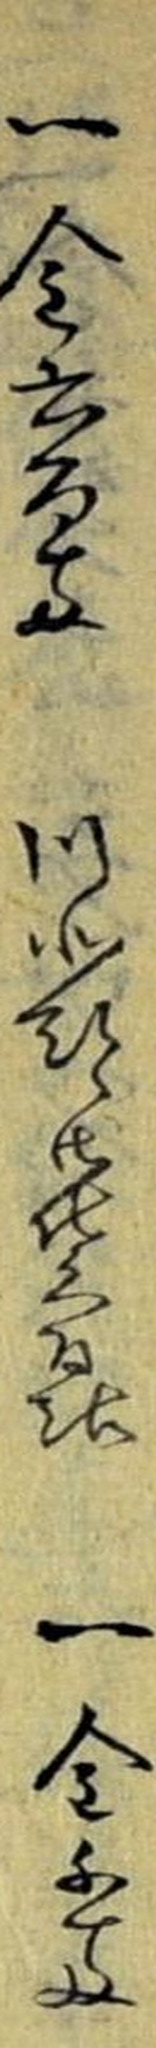一金六百両川北領へ御貸付銀一金千両町方へ同断
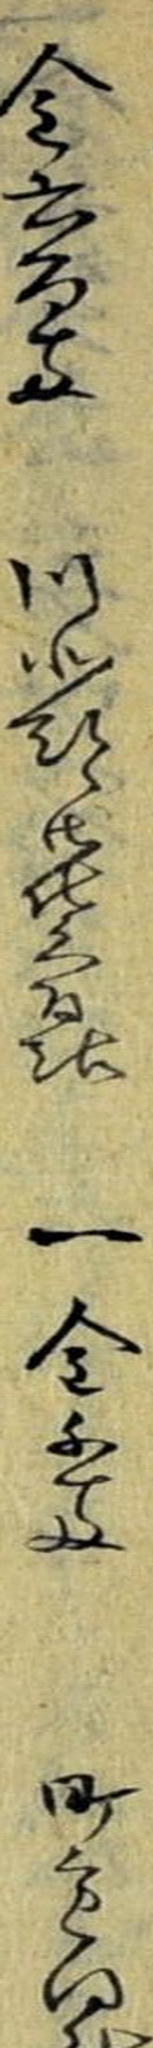一金六百両川北領へ御貸付銀一金千両町方へ同断
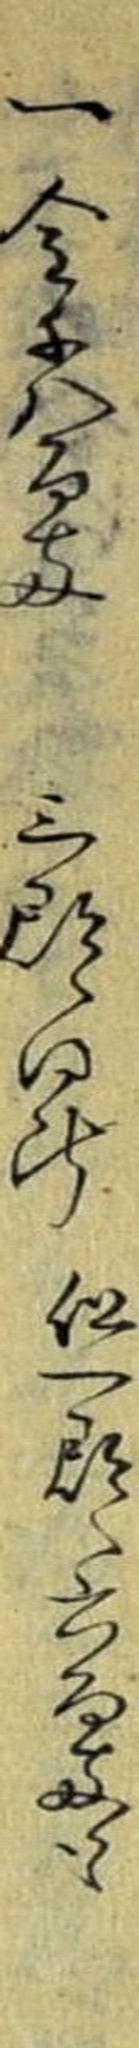一金千八百両三郡へ同断但一郡へ六百両ツヽ
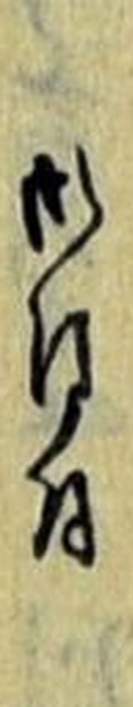御目付
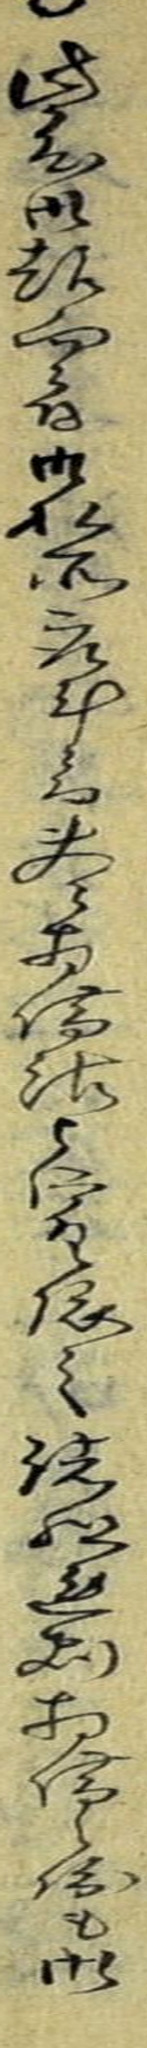〇此度御趣向ニ付御札所取計ニ而夫々拝借銀被仰付候依之諸組連判拝借之儀も御
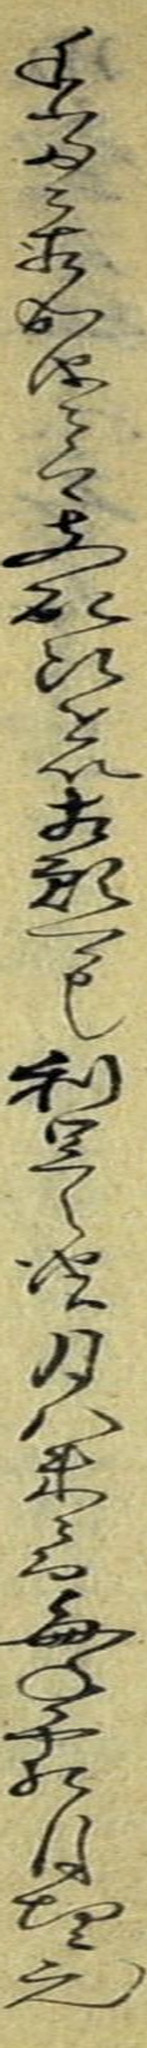手当ニ相成儀ニ候ハヽ支配頭を以相願可申候利足之儀ハ月八朱ニ而毎年霜月切ニ元
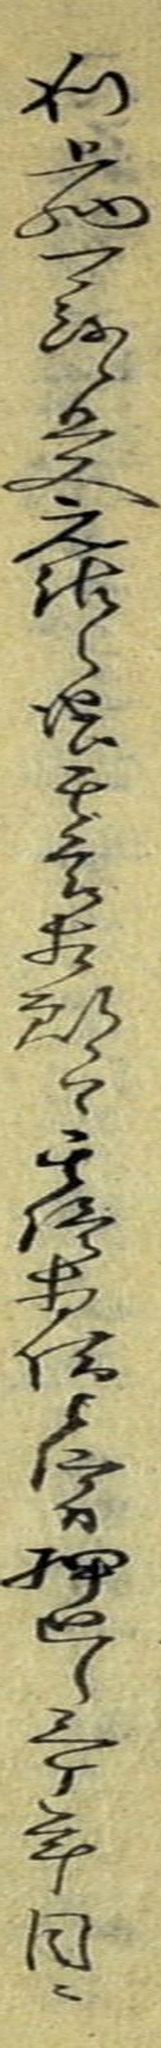利上納可致候且又元銀之儀ハ其節相願候ハヽ其儘拝借被仰付押廻し三ケ年目ニ
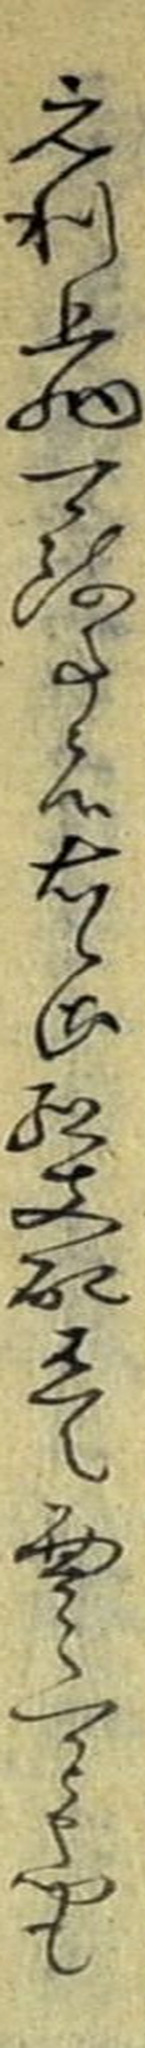元利上納可致事ニ候右之趣組支配有之面々へ可被申聞候
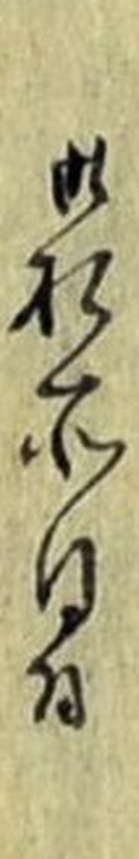御札所目付
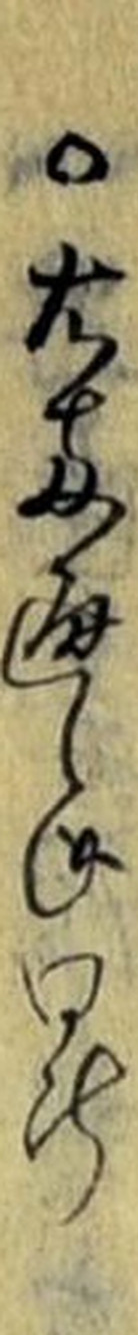〇右両通之趣同断
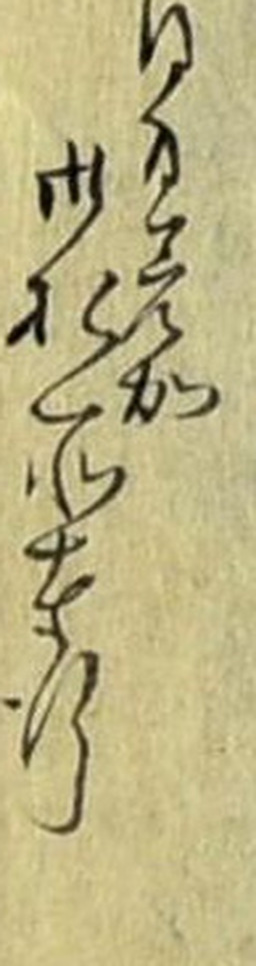御札所目付
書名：命令之部 三
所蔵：福井県文書館 Fukui Prefectural Archives
